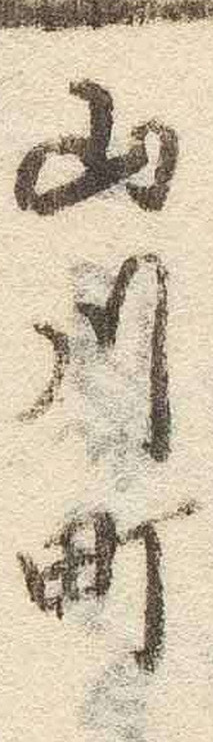山本町
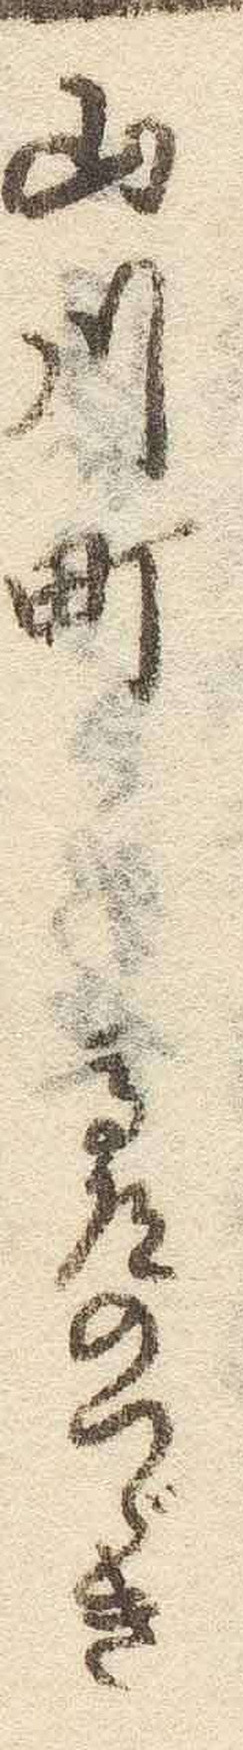山川町馬道のつゞき
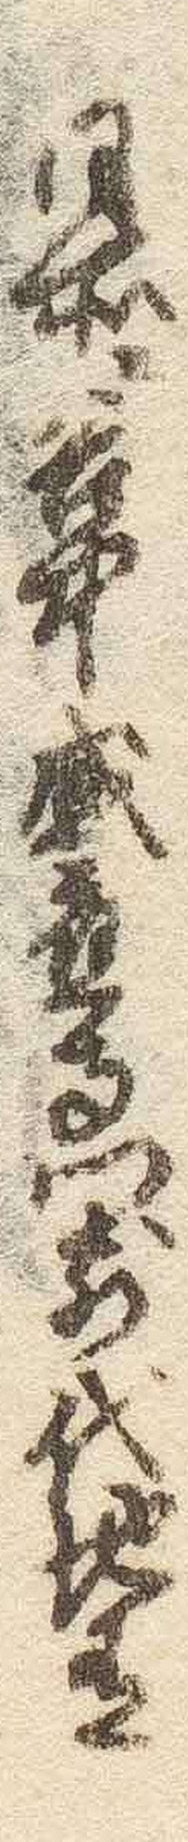同所に谷中感応寺門前代地有
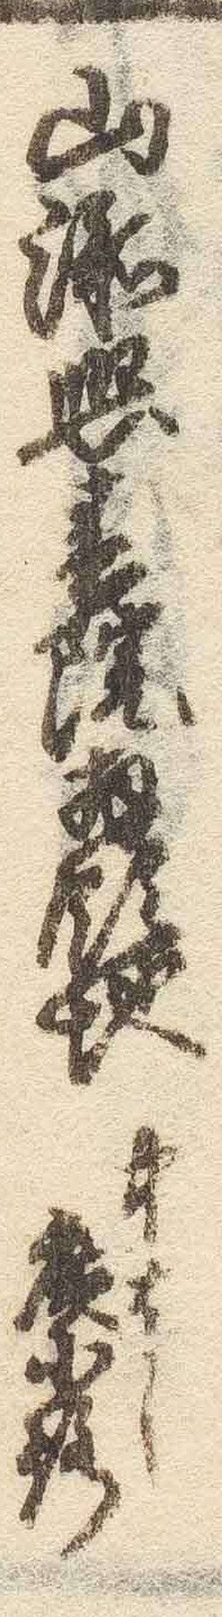山添煕春院拝領地中はし
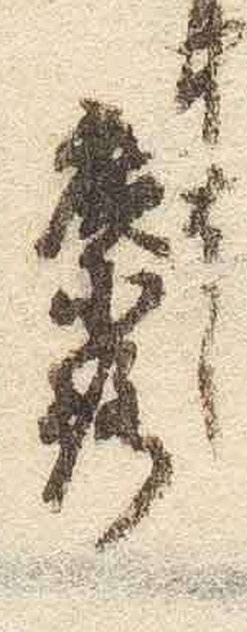広小路
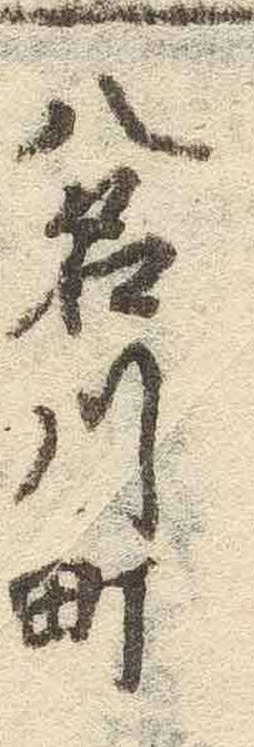八名川町
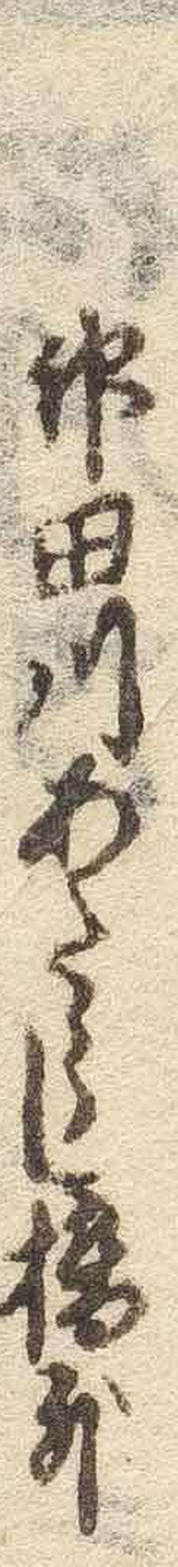神田川あたらし橋外
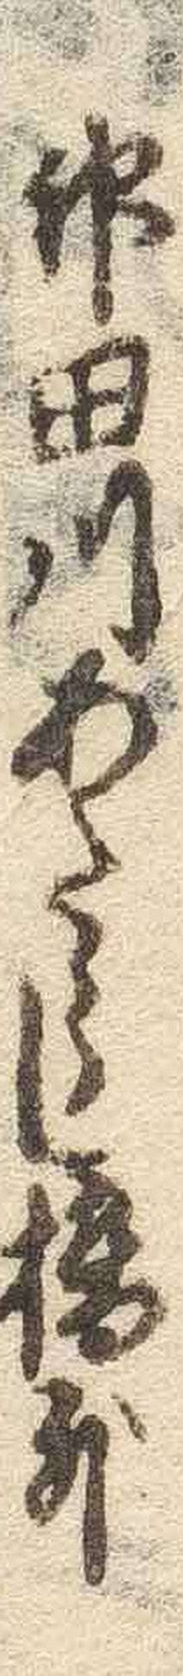神田川あたらし橋外
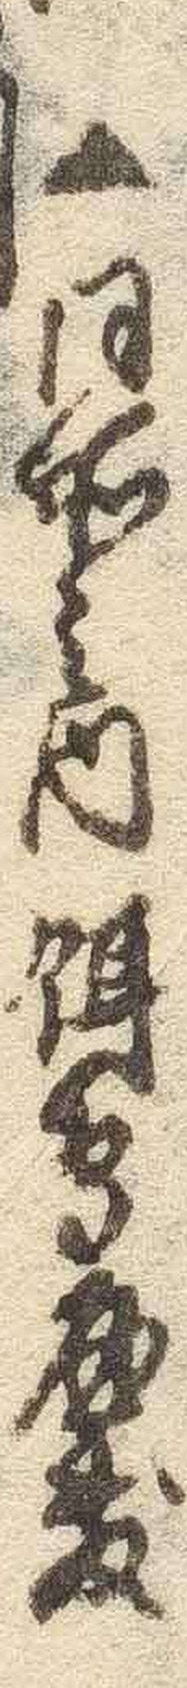▲同所之内餌鳥屋敷
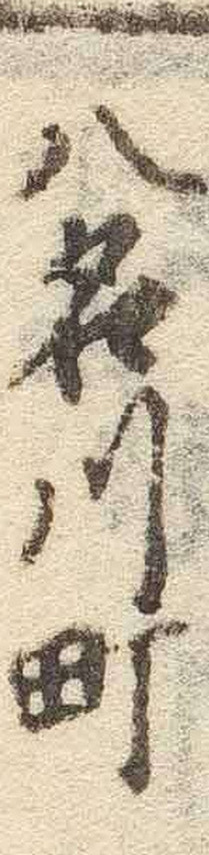八名川町
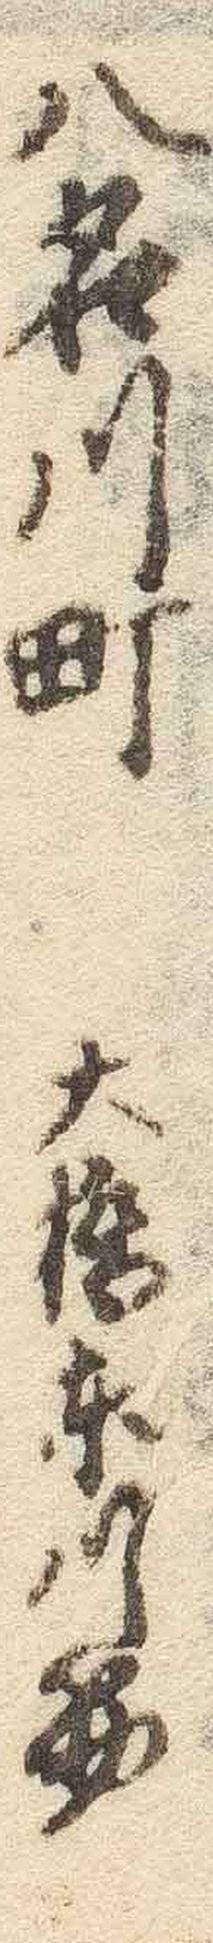八名川町大橋東川筋
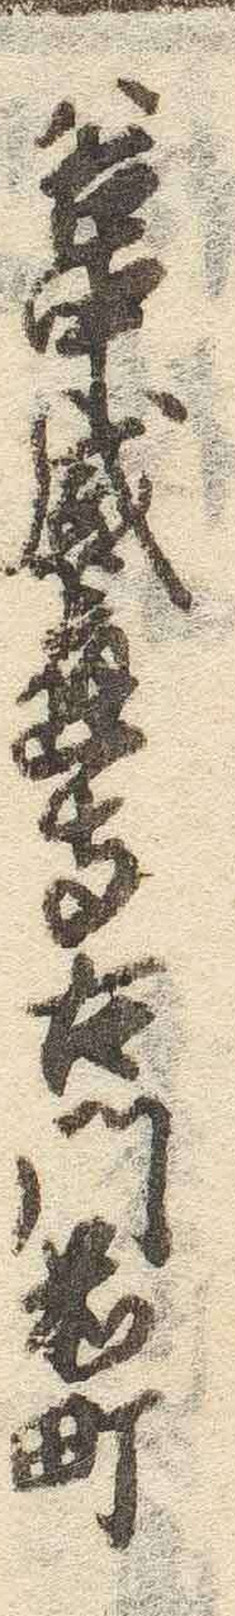谷中感応寺古門前町
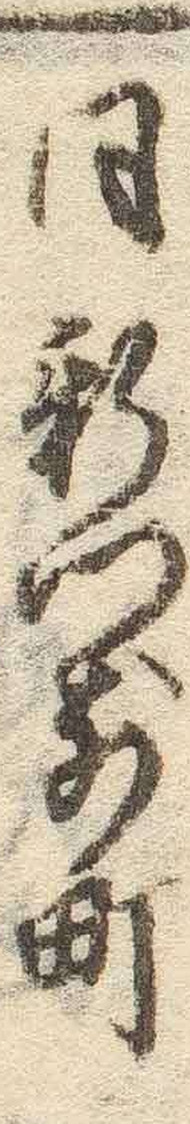同新門前町
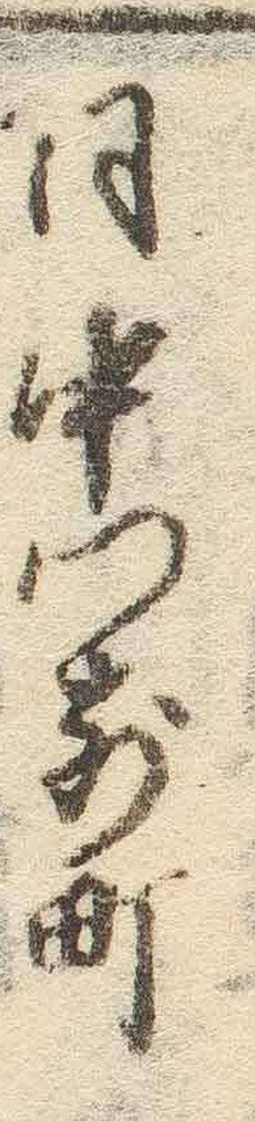同中門前町
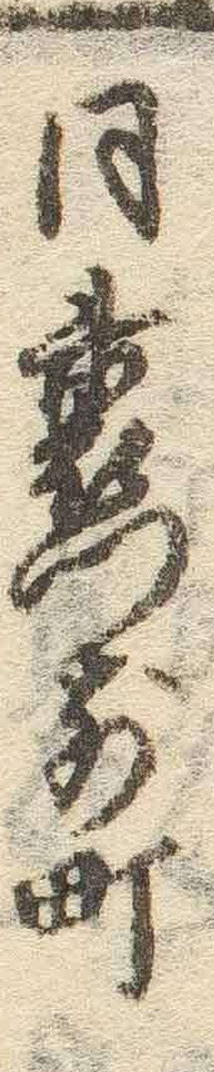同裏門前町
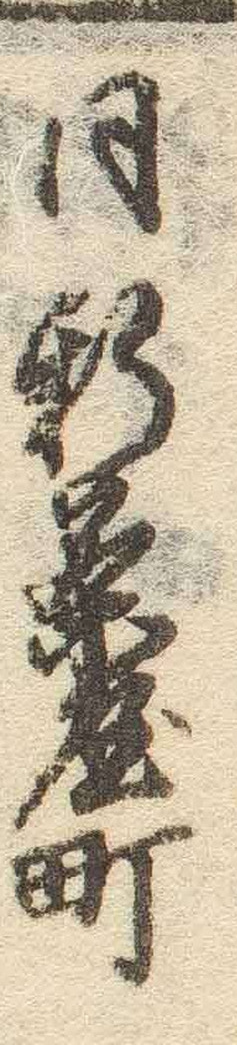同新茶屋町
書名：江戸町独案内
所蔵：東京学芸大学附属図書館 国文学研究資料館
